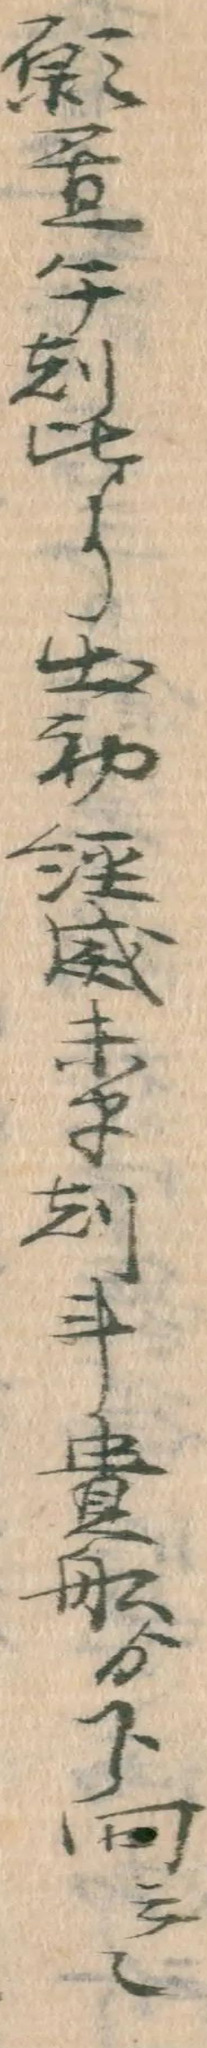願置午刻頃より出勤経威未半刻斗貴船ゟ下向云々
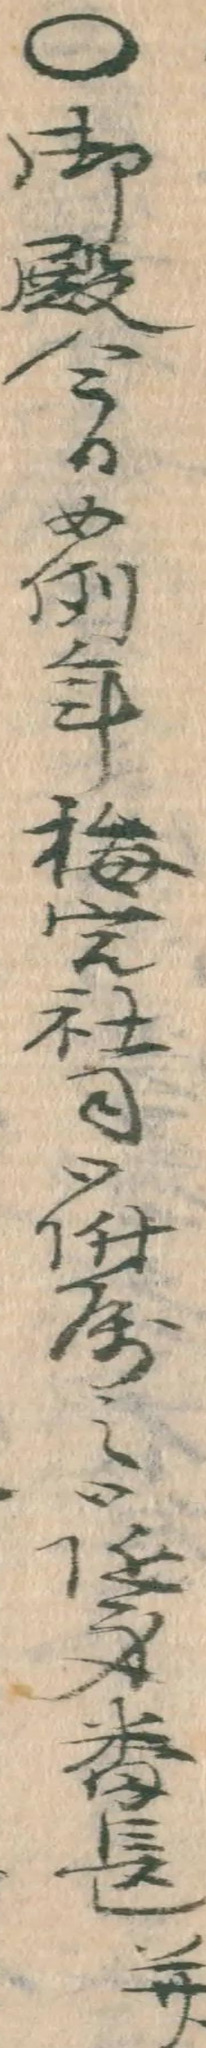◯御殿今日如例年梅宮社司御附属之御随身番長并
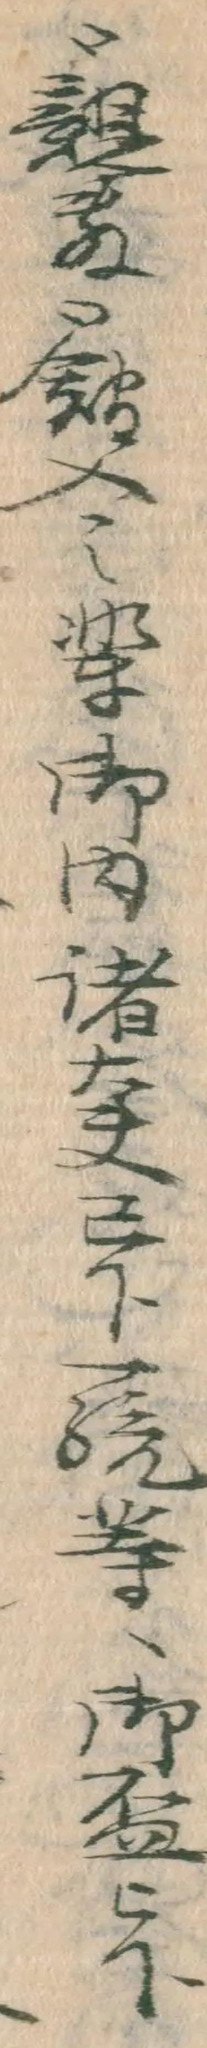御親敷御館入之輩御内諸大夫已下一統等へ御盃被下
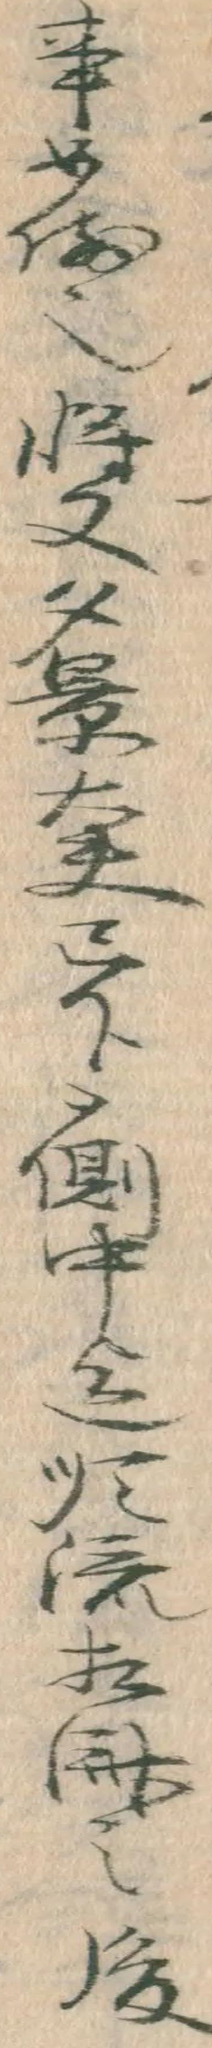事如例也将又夕景大夫已下御側中迄順流相済之後
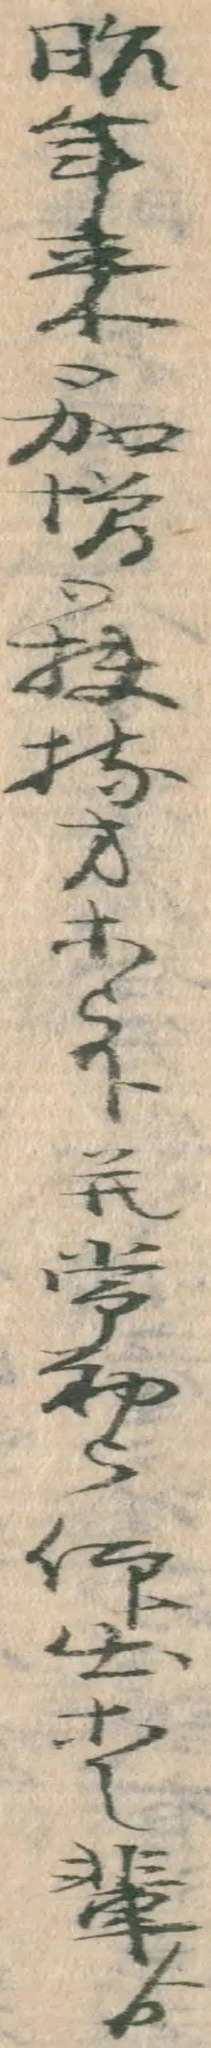昨年来御加増御扶持方等被下并常勤被仰出︎等之輩ゟ
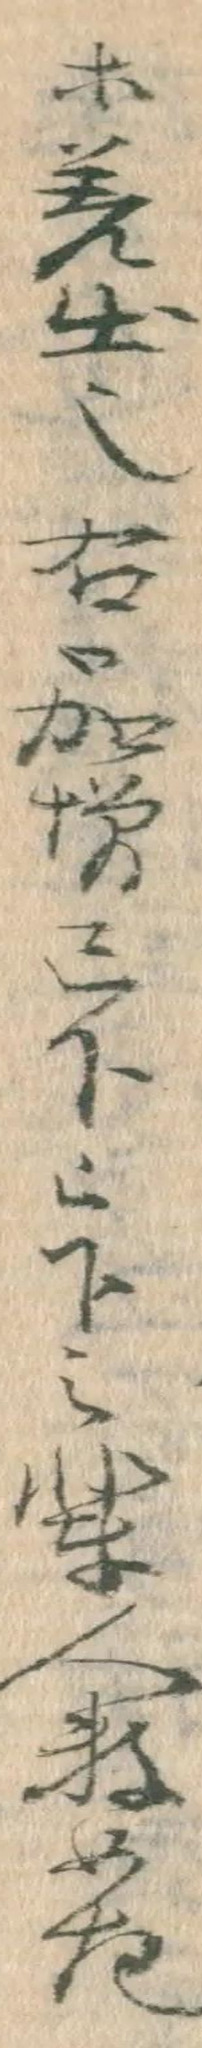等差出也右御加増已下被下之輩人数如左
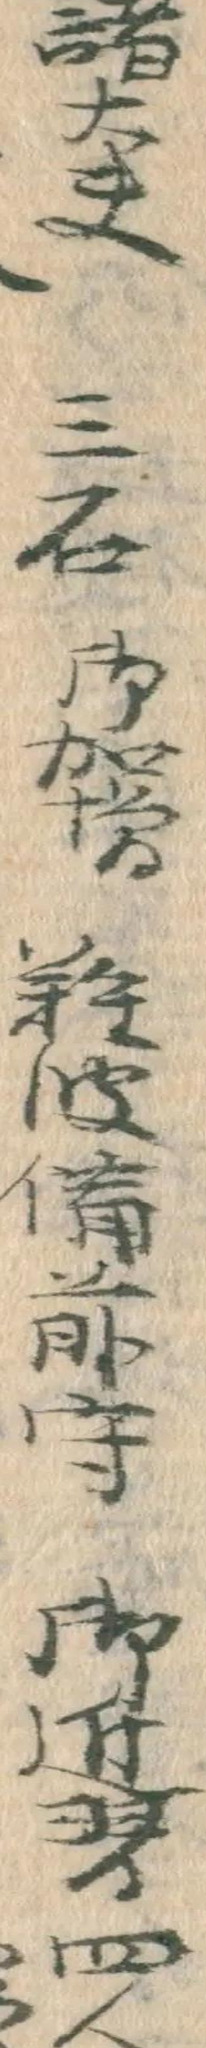諸大夫三石御加増難波備前守御近習四人
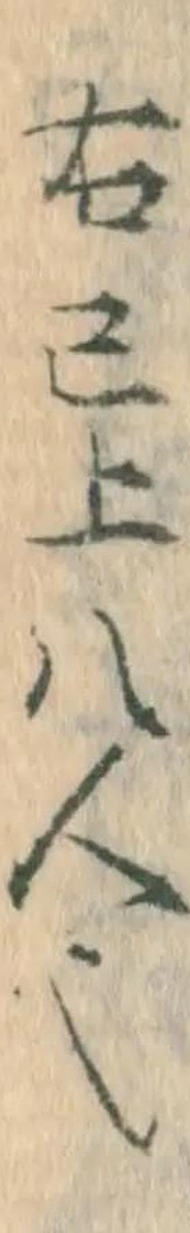右已上八人也
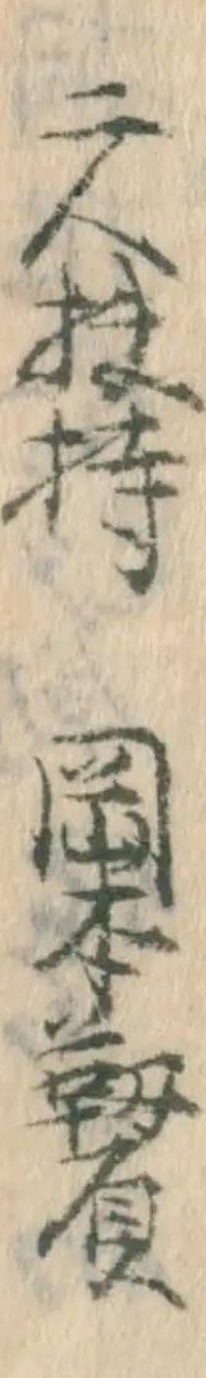二人扶持岡本靭負

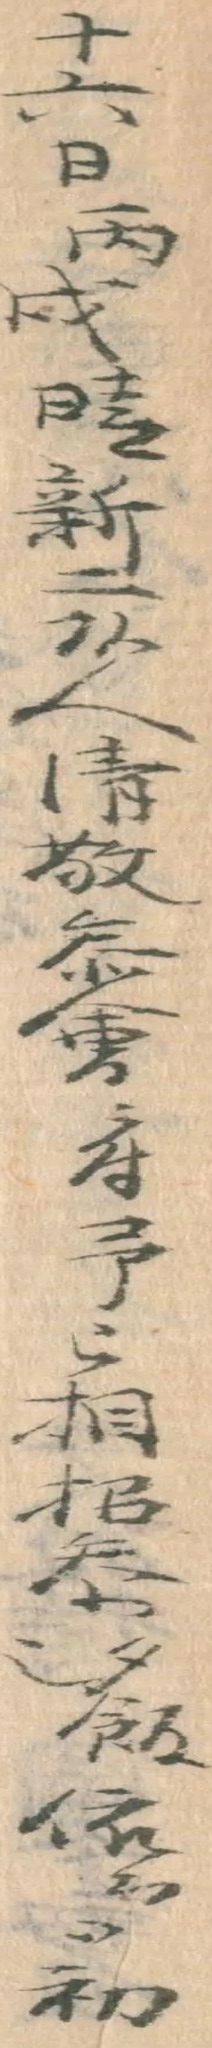十六日丙戌晴新二頭人清敬参会ニ付予被相招参也夕飯依而御初
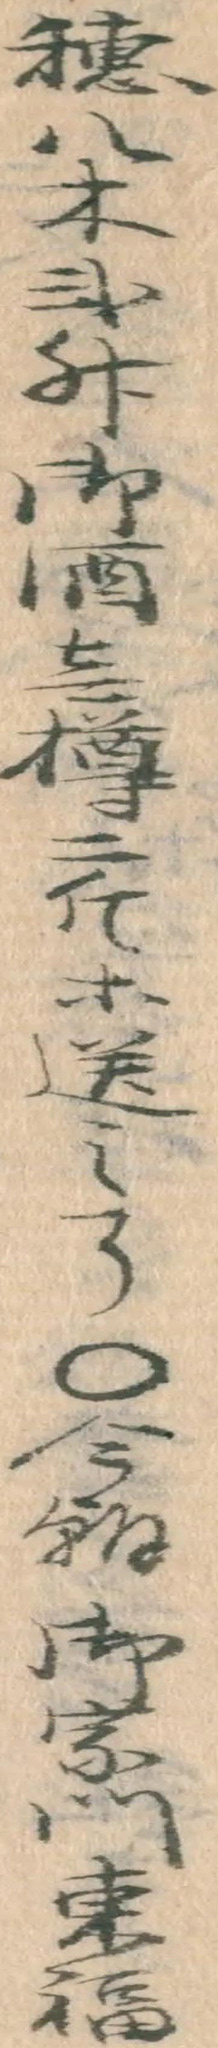穂八木弐升御酒壱樽二斤等送之了〇今朝御家門東福
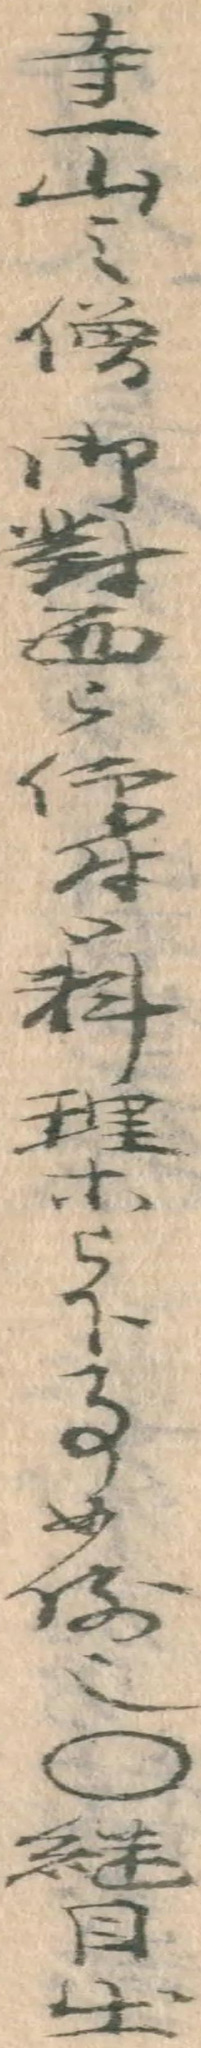寺一山之僧御対面被仰付御料理等被下事如例也〇継目出
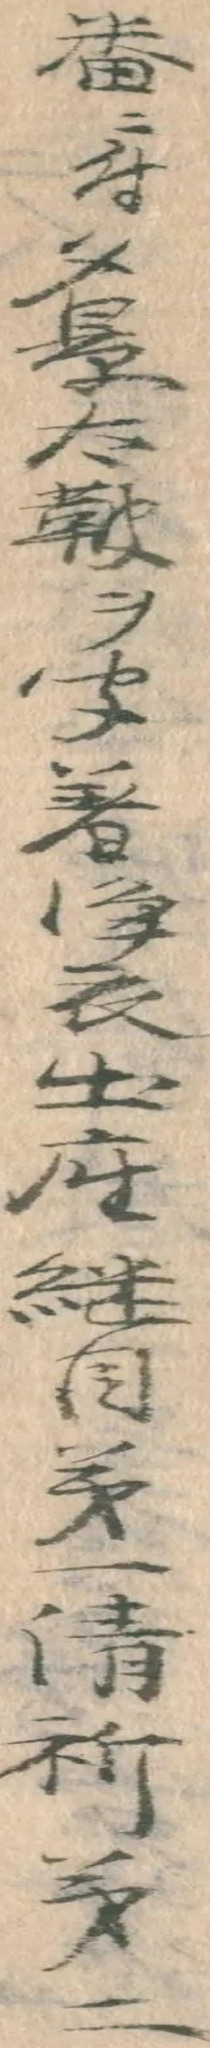番ニ付夕景太鞁ヲ聞着浄衣出座継目第一清祈第二
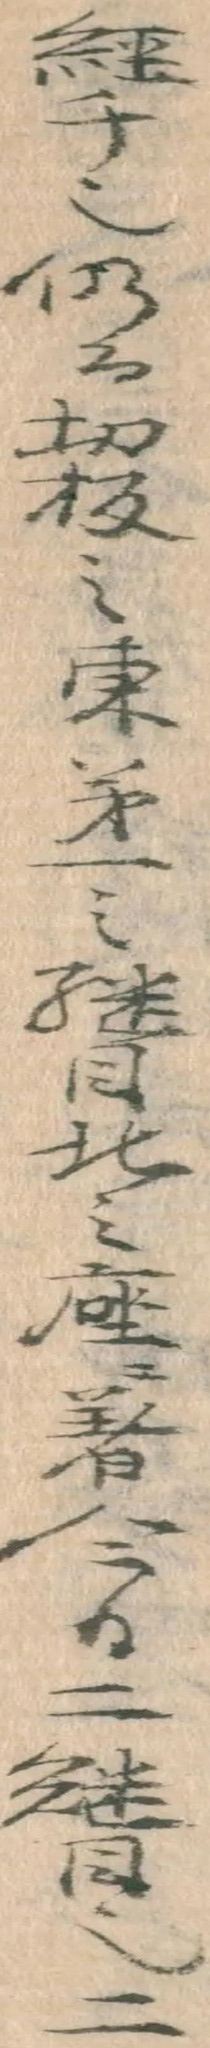経千也仍而切板之東第一之継目北之座ニ着今日二継目也二
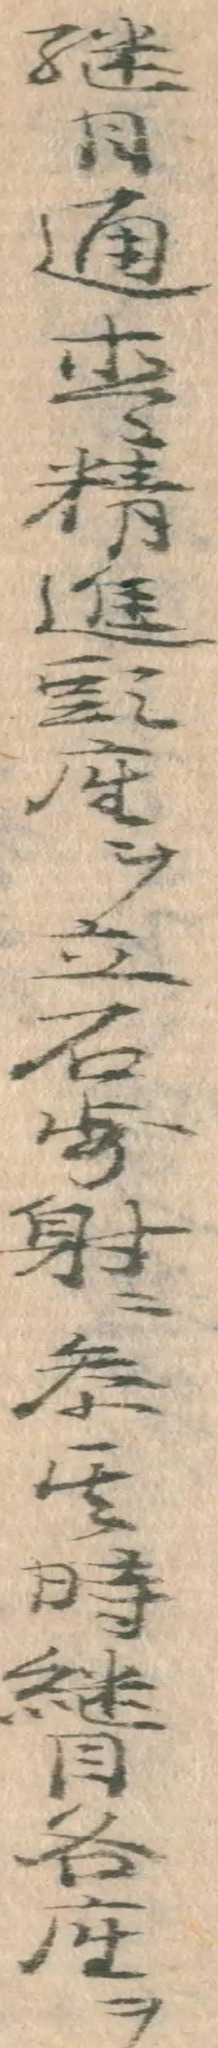継目通直ニ精進頭座ヲ立石歩射ニ参其時継目各座ヲ
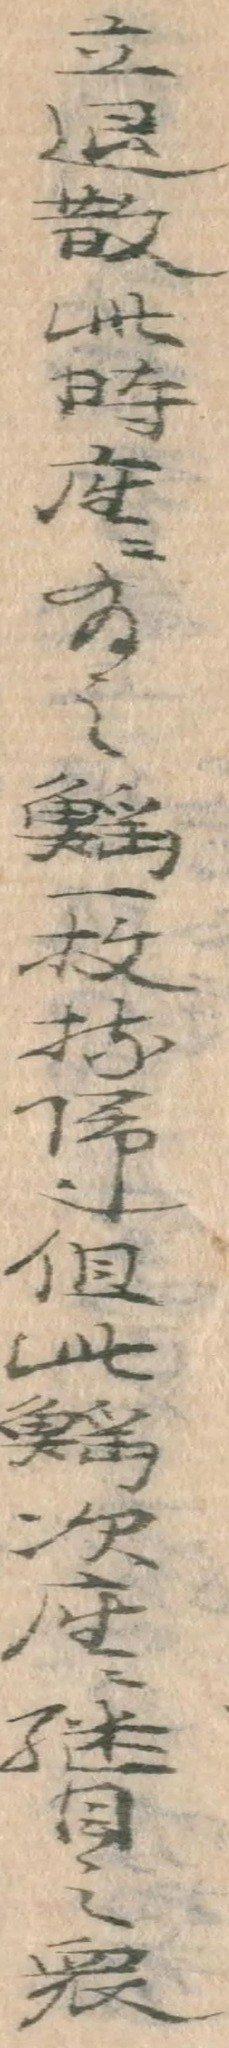立退散此時座ニ有之鰩一枚持帰也但此鰩次座ニ継目之衆
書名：賀茂社記録. 第64冊
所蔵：国立国会図書館 National Diet Library, JAPAN
